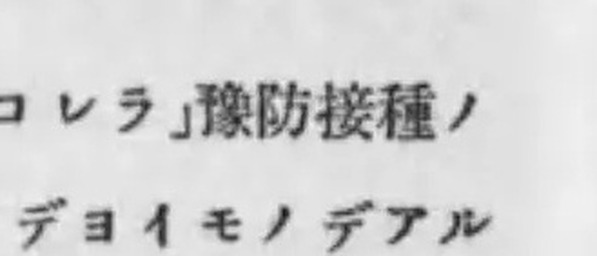「コレラ」予防接種

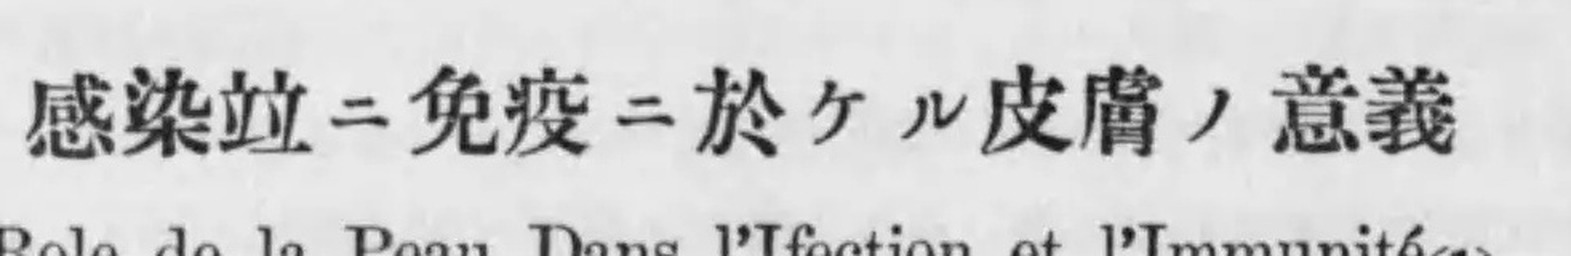感染並に免疫に於ける皮膚の意義

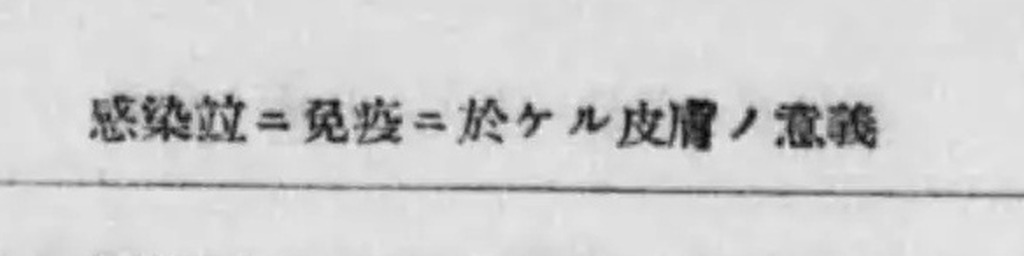感染並に免疫に於ける皮膚の意義

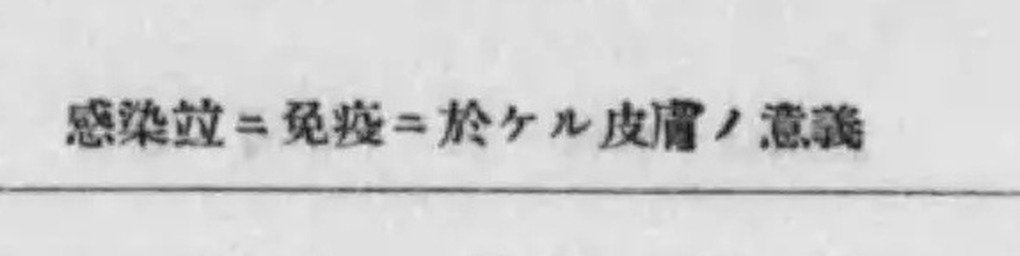感染並に免疫に於ける皮膚の意義

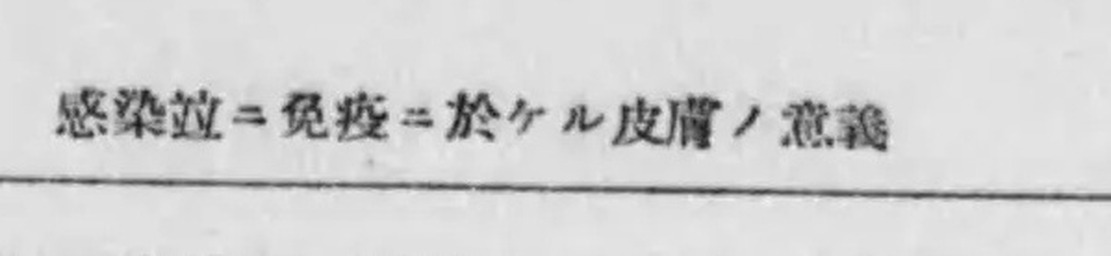感染並に免疫に於ける皮膚の意義
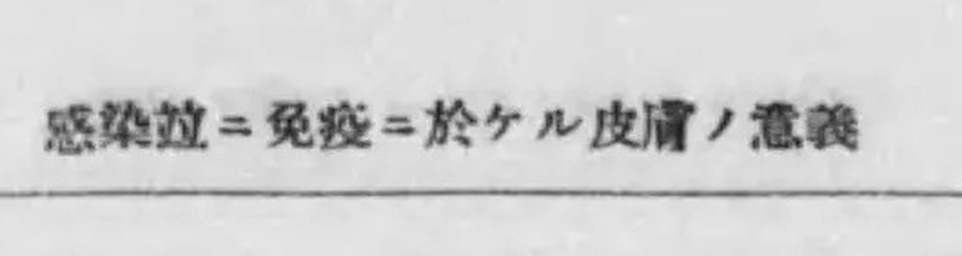感染並に免疫に於ける皮膚の意義

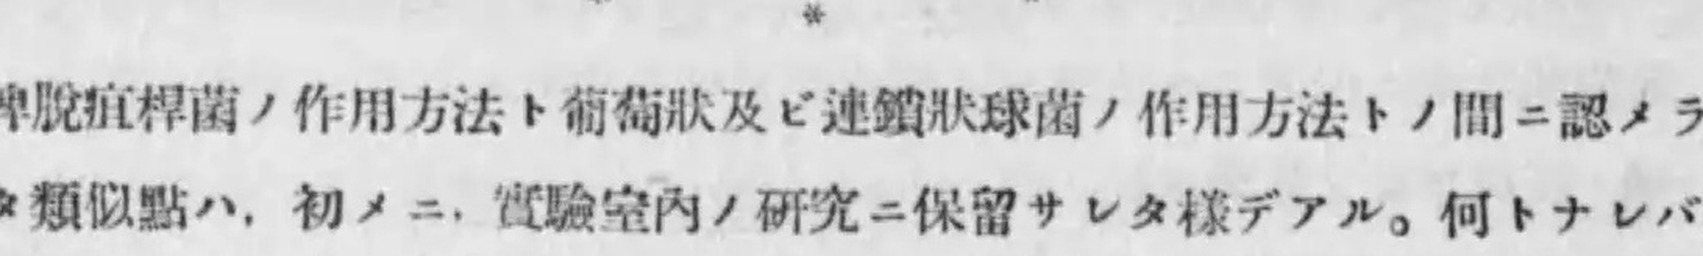脾脱疽桿菌の作用方法と葡萄状及び連鎖状球菌の作用方法との間に認めら

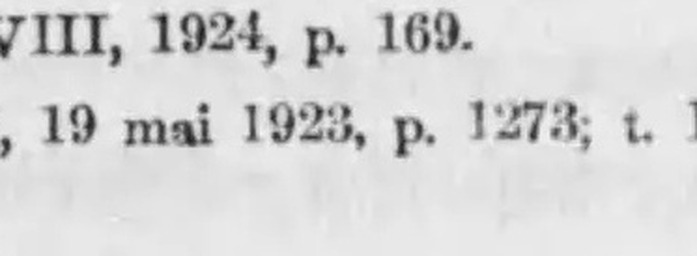,,,,,,,,,;,-

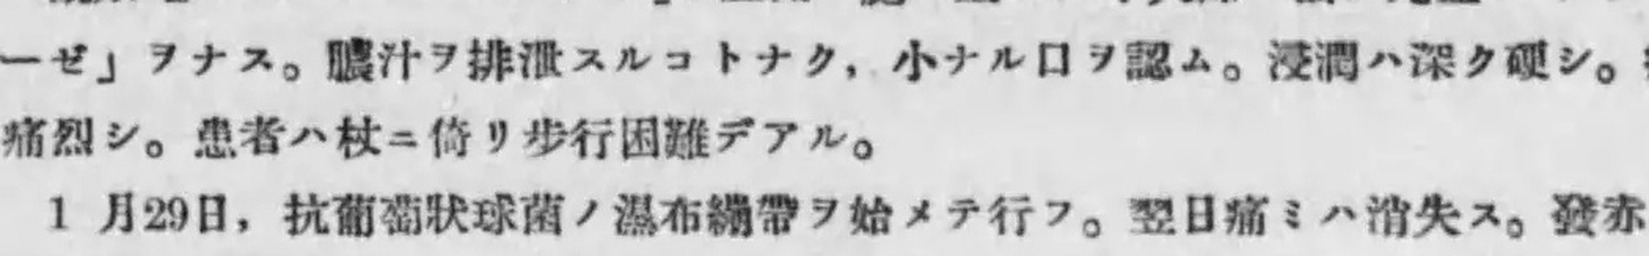痛烈し。患者は杖に倚り歩行困難である。
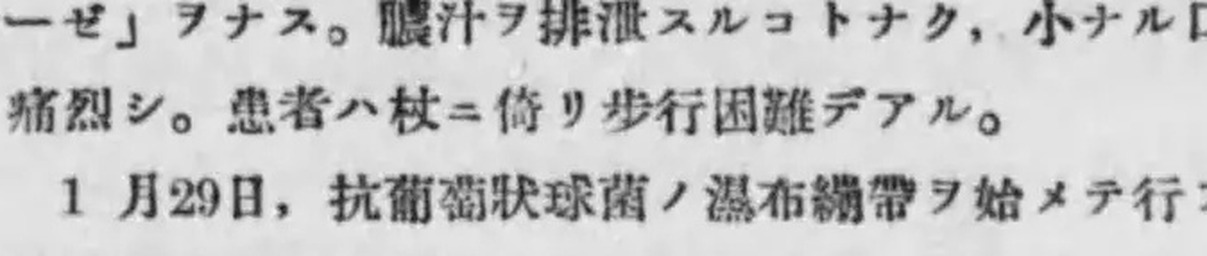痛烈し。患者は杖に倚り歩行困難である。

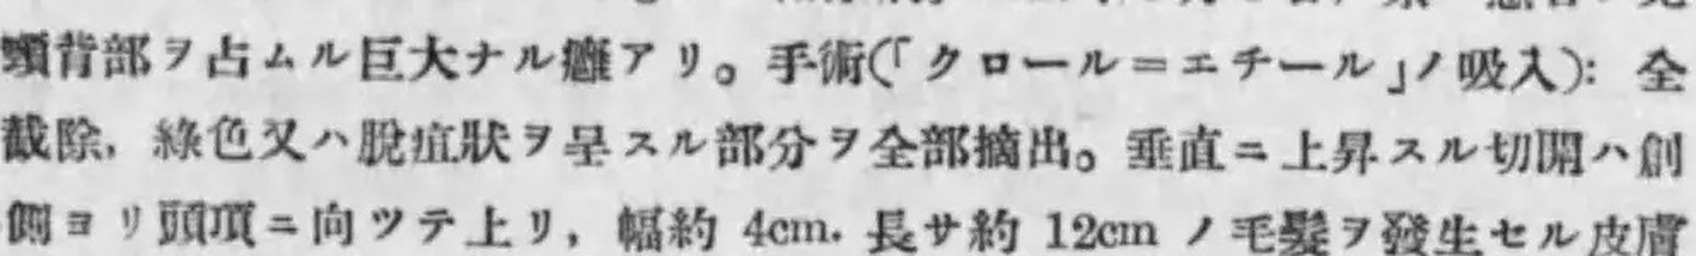病竈を截除、緑色又は脱疽状を呈する部分を全部摘出。垂直に上昇する切開は創

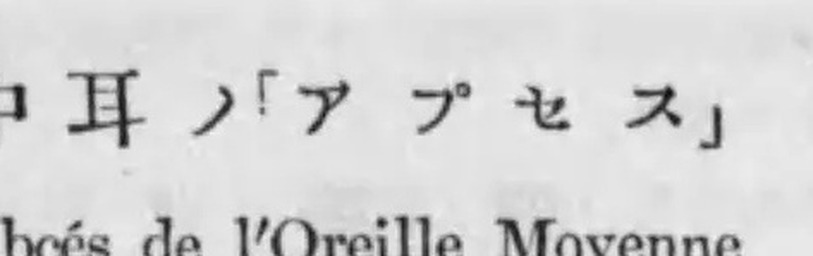中耳の「アプセス」
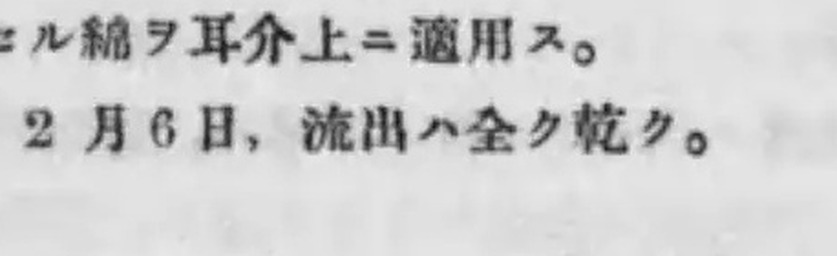月日、流出は全く乾く。
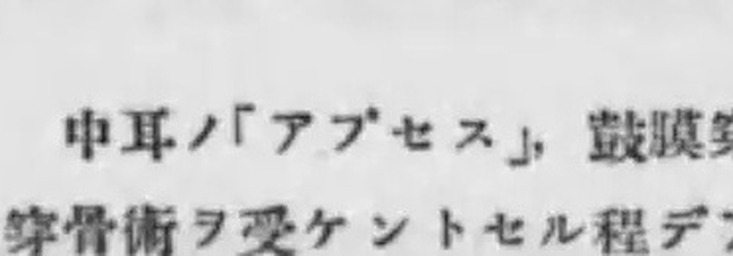中耳の「アプセス」
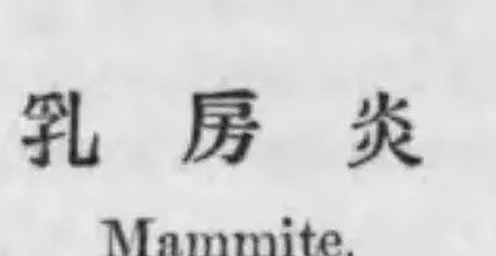乳房炎
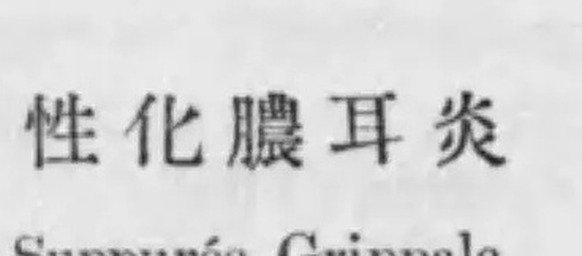感冒性化膿耳炎
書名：伝染病ニ於ケル免疫ニ関スル研究
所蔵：国立国会図書館 National Diet Library, JAPAN
